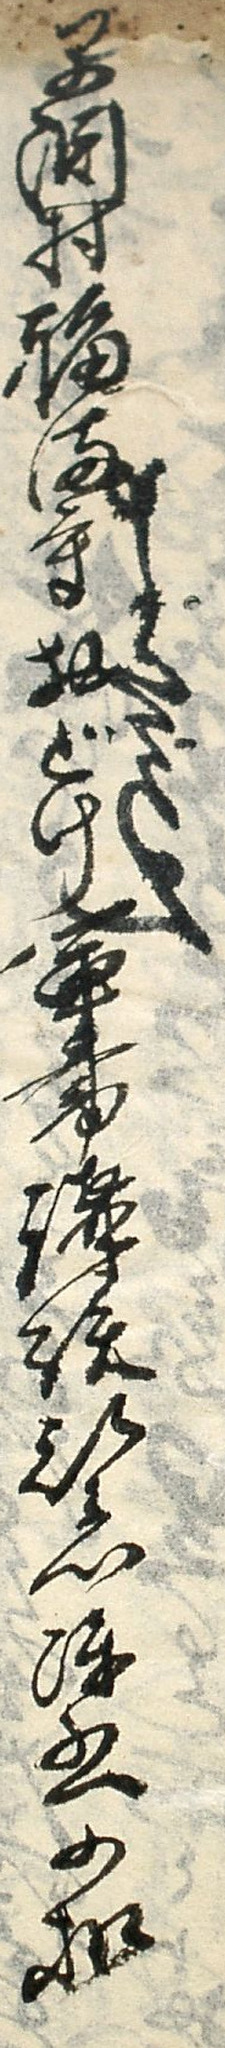早渕村福満寺おどけ軍書講談行着添書の扣
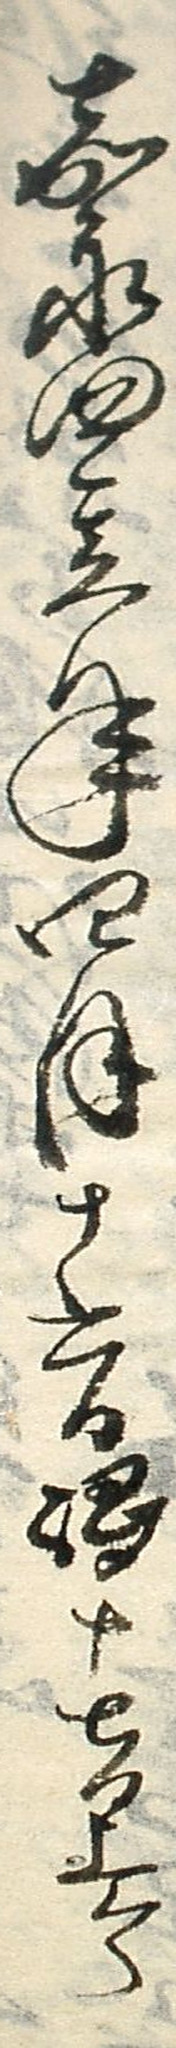嘉永四亥年四月十六日認メ十七日上ケ候

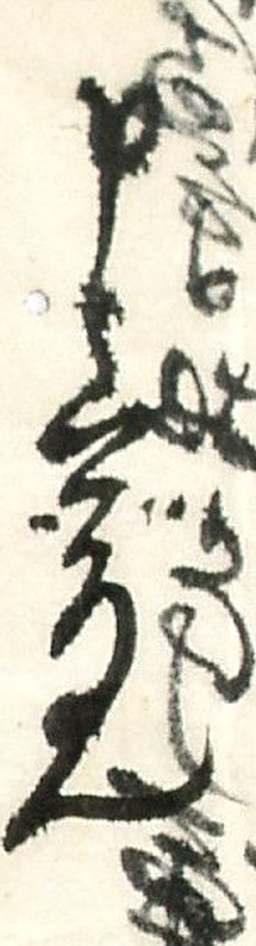申上覚
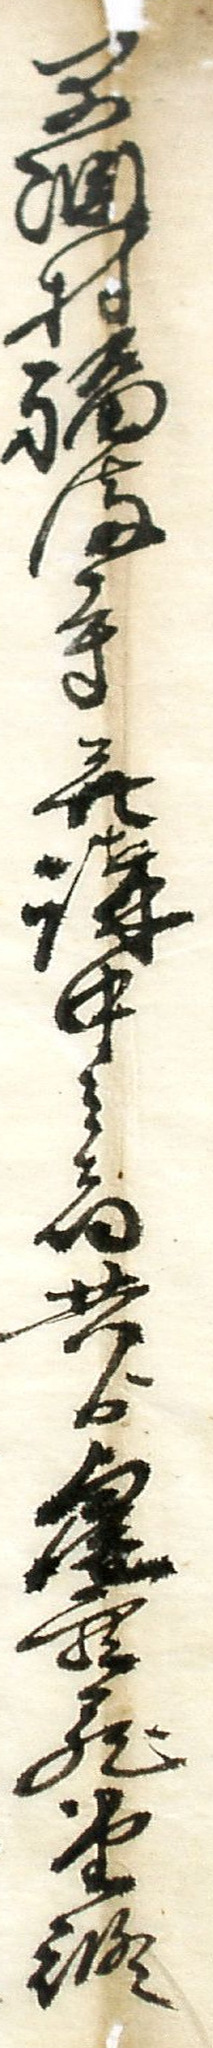早渕村福満寺幷講中之者共ゟ虚空蔵堂修
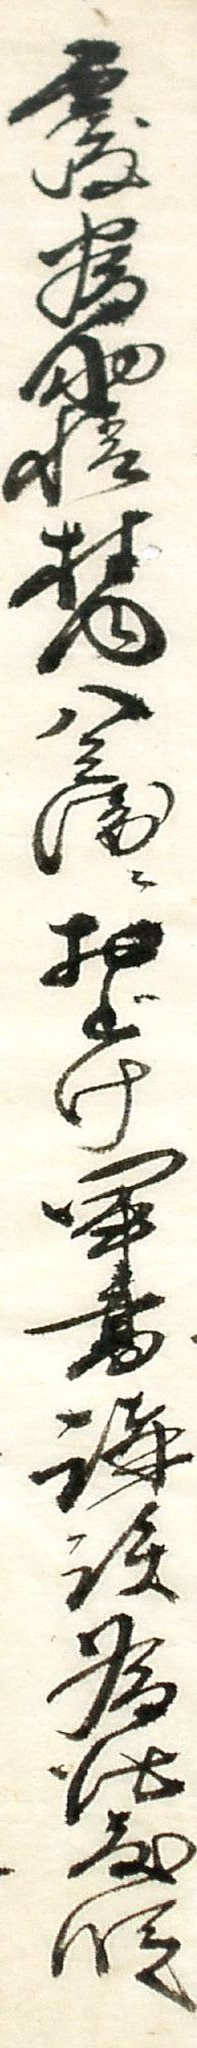覆為助情村内八兵衛ニおどけ軍書講談為仕度段
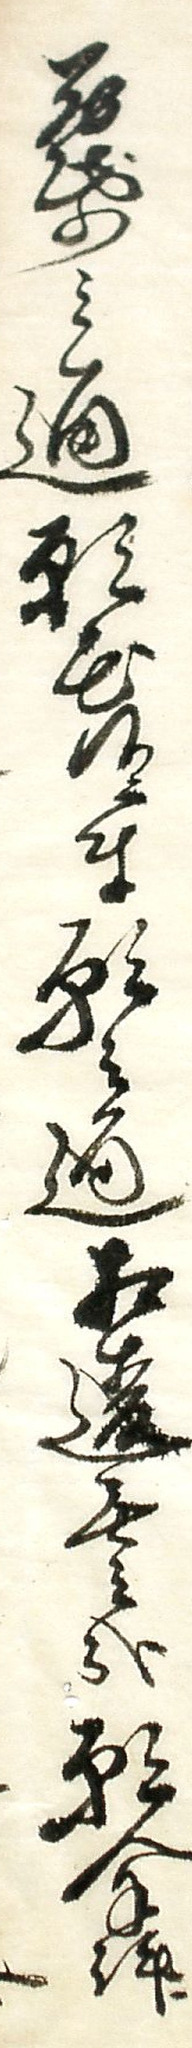別帋之通願出候ニ付願之通相違無之哉願人手許
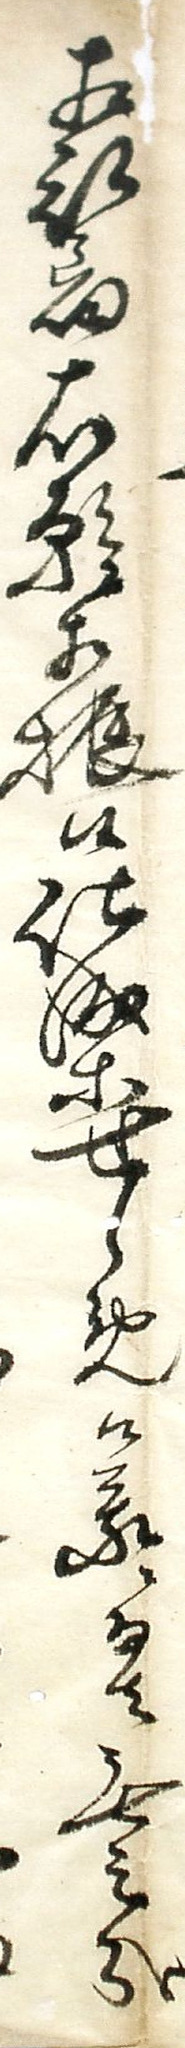相行着右願ニ相振候仕成等せしめ候義ニ而者無之哉
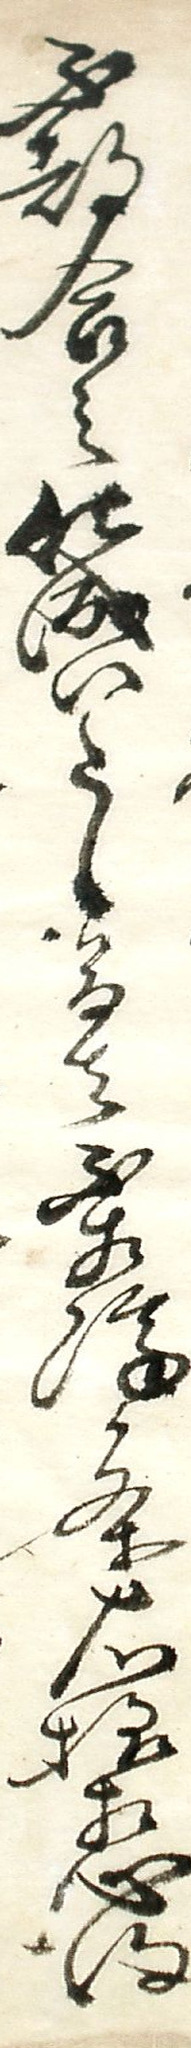不都合之仕成いたし候而者不相済候条右様相心得
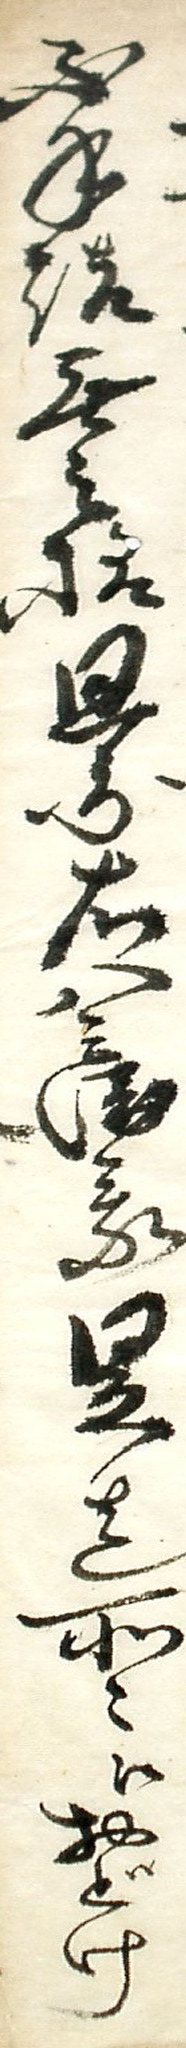不手詰無之様且亦右八兵衛義是迄所々江おどけ
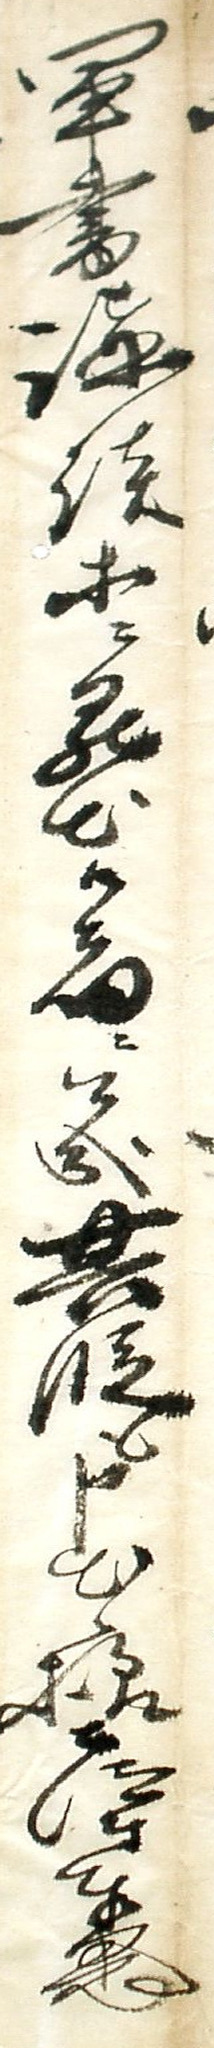軍書講談等ニ罷出候者ニ候哉其段も申出候様被仰付奉畏
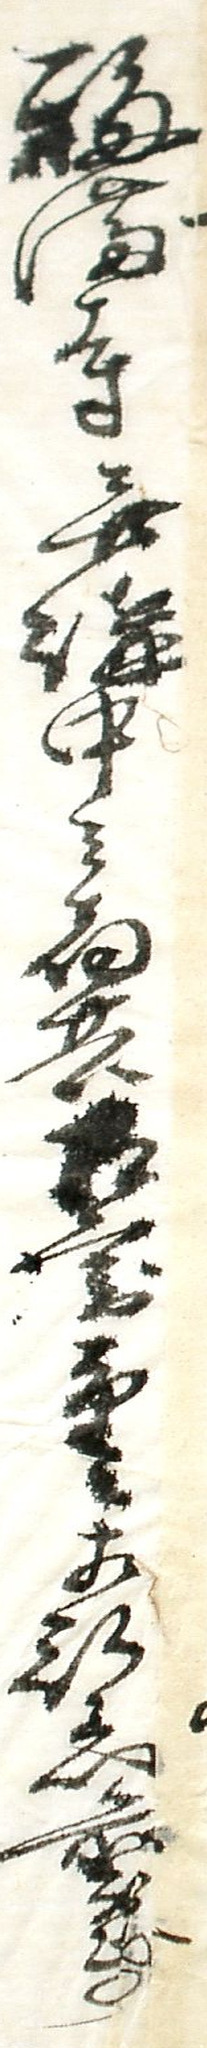福満寺幷講中之者共召寄重々相行着候所別帋
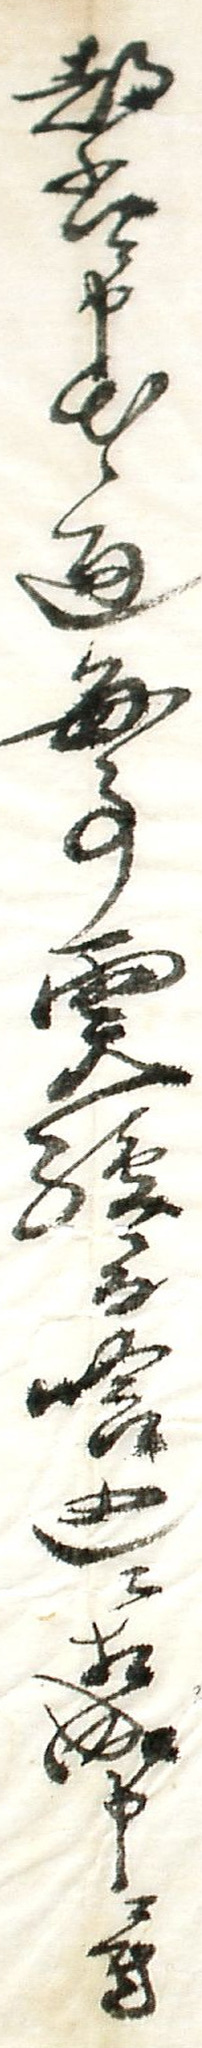都書ニ申出候通毎事雨天續ニ而喰込ニ相成申ニ付
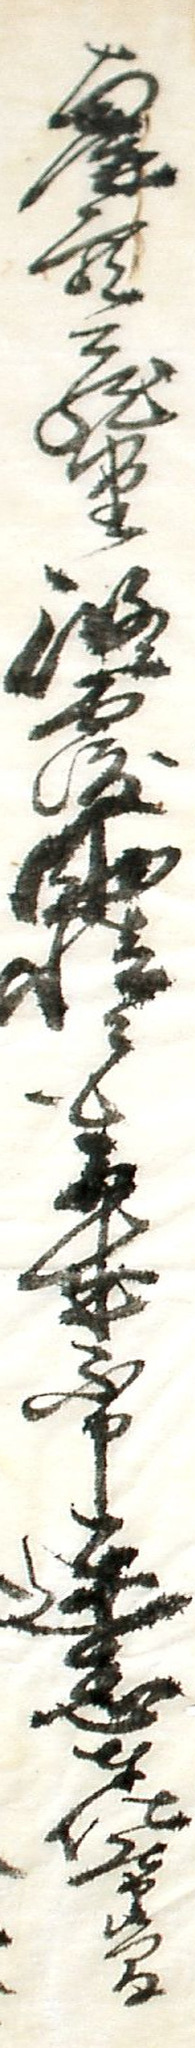虚空蔵堂修覆助情ニも相成不申迷惑奉仕居候間
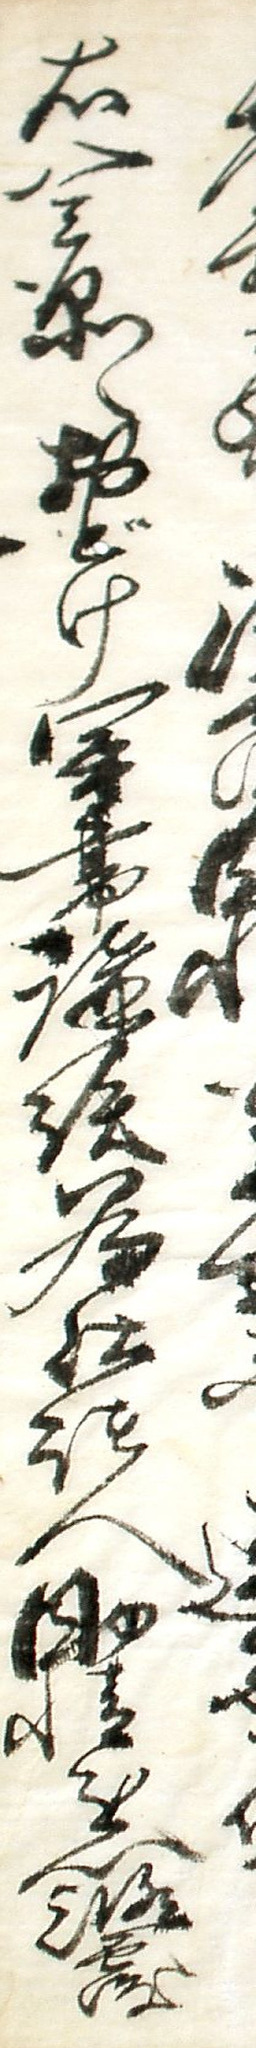右八兵衛へおどけ軍書講談為仕諸人助情を以修覆
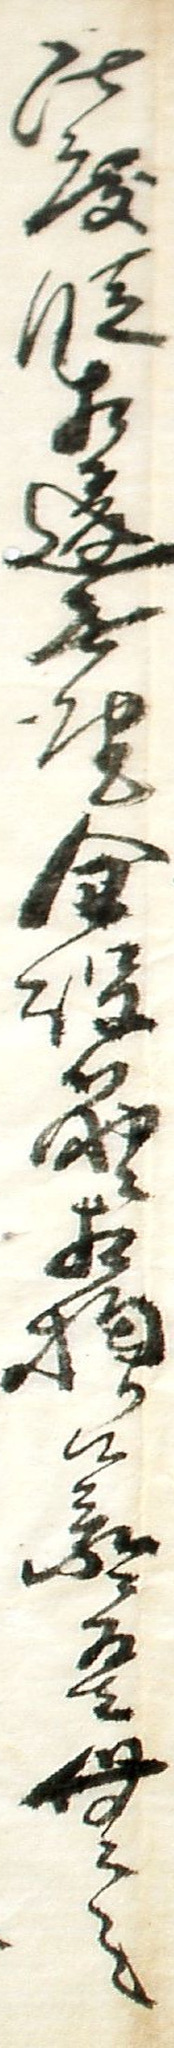仕度段相違無御坐候全役筋ニ相拘り候義ニ而者無之
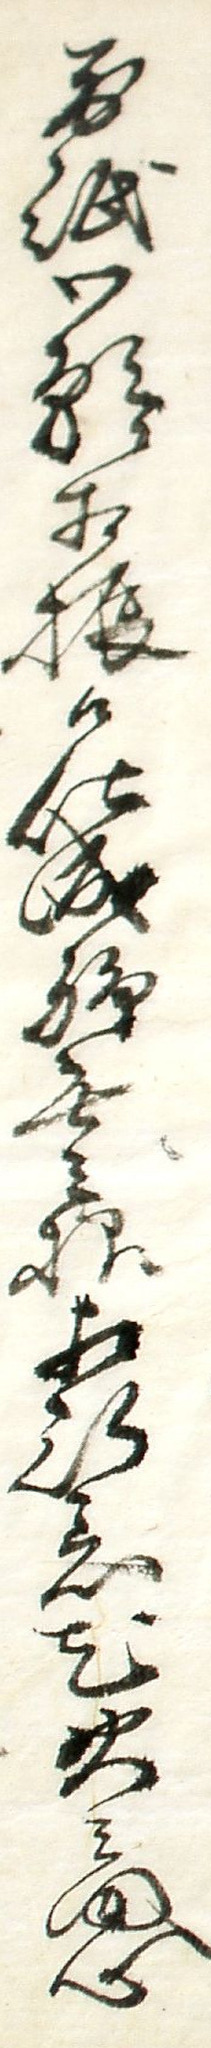別紙御願ニ相振候仕成聊無之様相行着尤火之用心
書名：（早渕村福満寺虚空蔵菩薩堂修復のためおどけ軍書講談願行着添え書控）
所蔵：鳴門教育大学 Naruto University of Education
